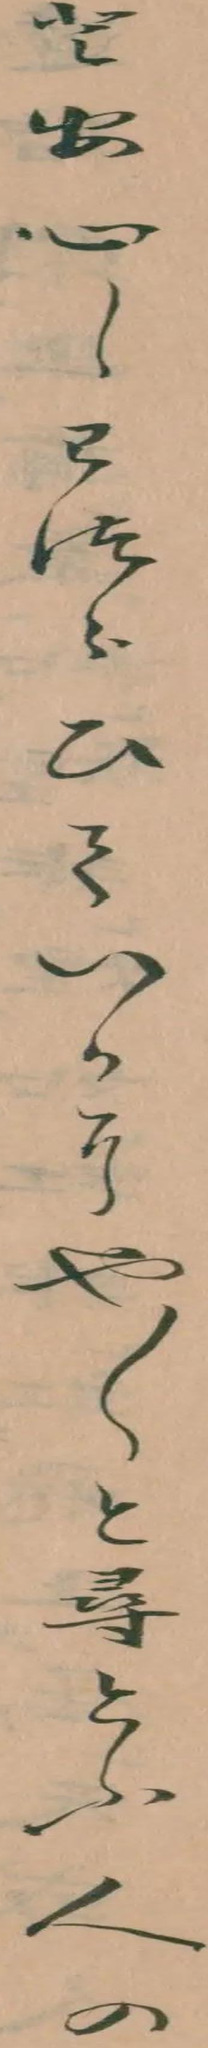と安心しわつらひていかにや〳〵と尋とふ人の
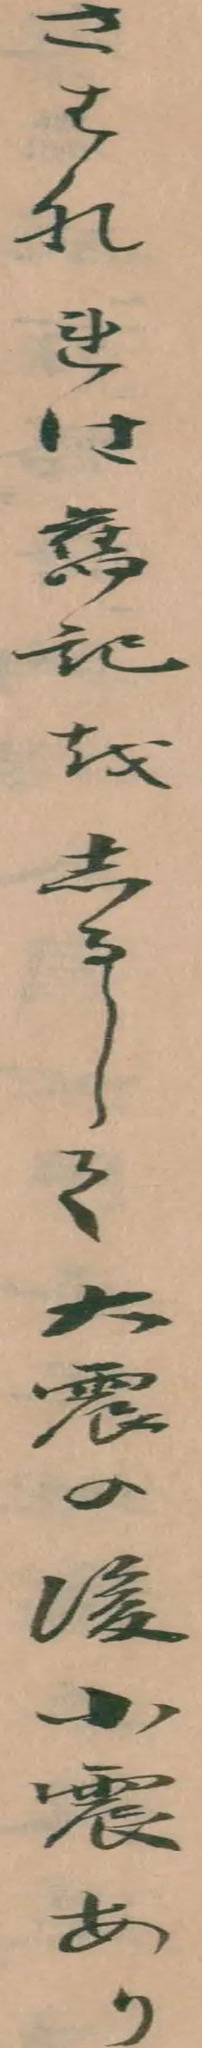さはなれは旧記をしるして大震の後小震あり
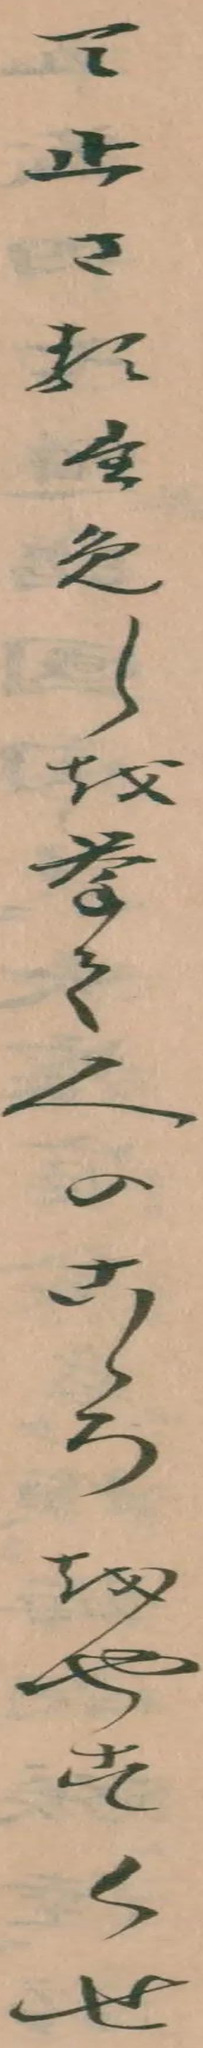て止さるためしを挙て人のこころをやすくせ
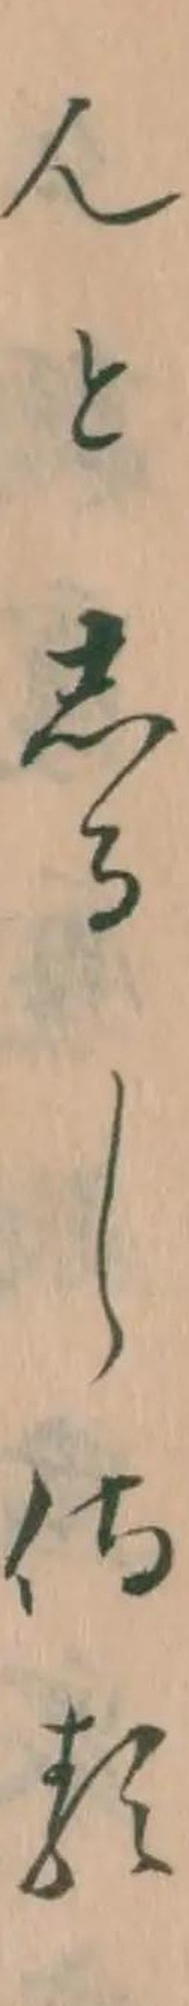んとしるし侍る
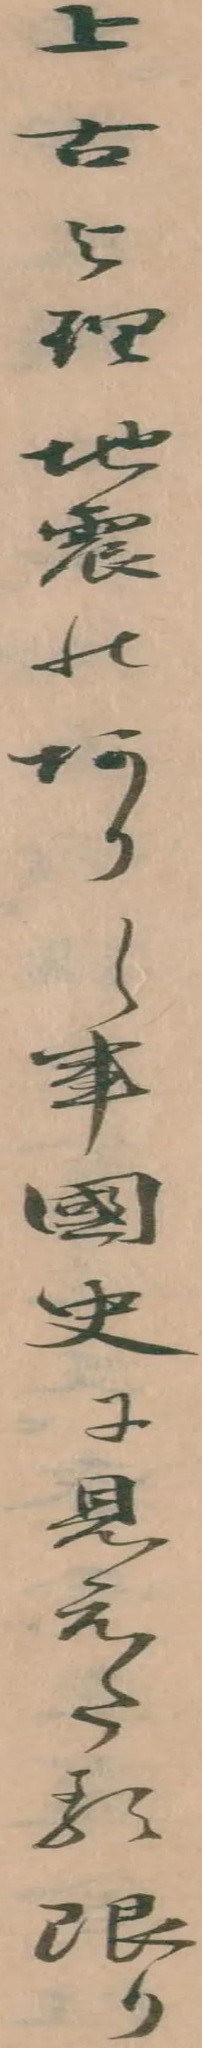上古より地震のありし事国史に見えたる限り
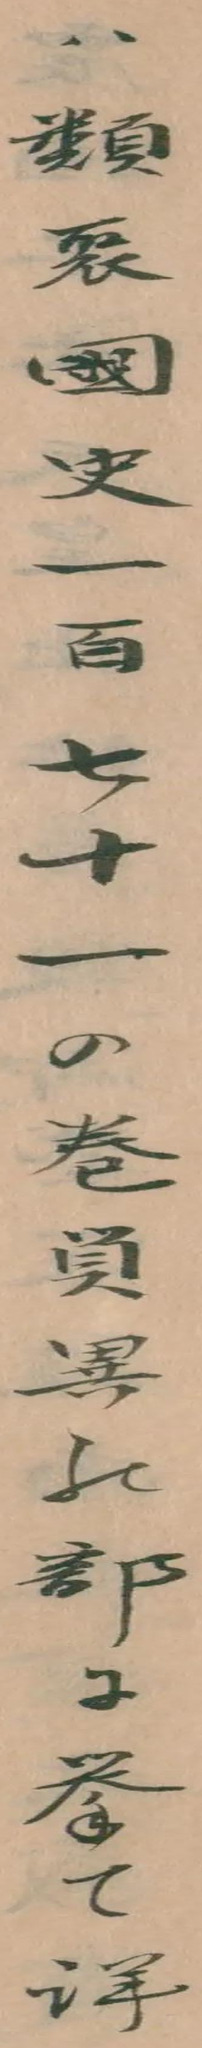は類聚国史一百七十一の巻災異の部に挙て詳
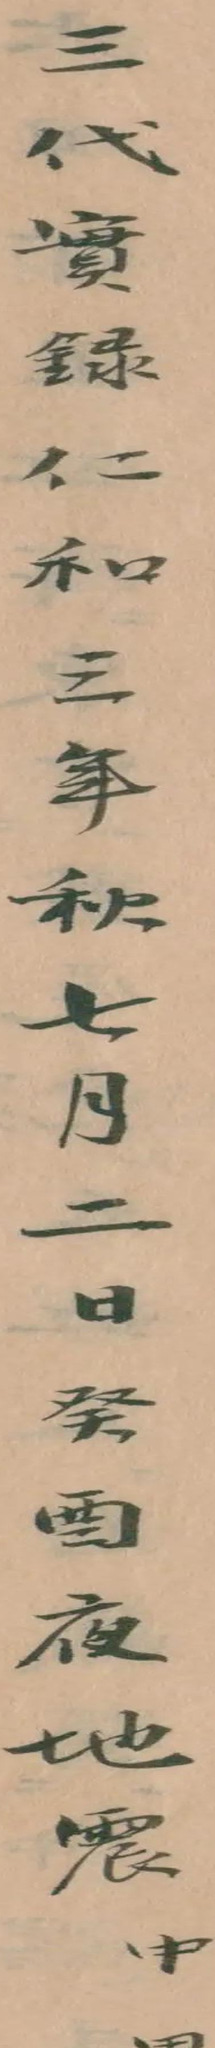三代実録仁和三年秋七月二日癸酉夜地震中略

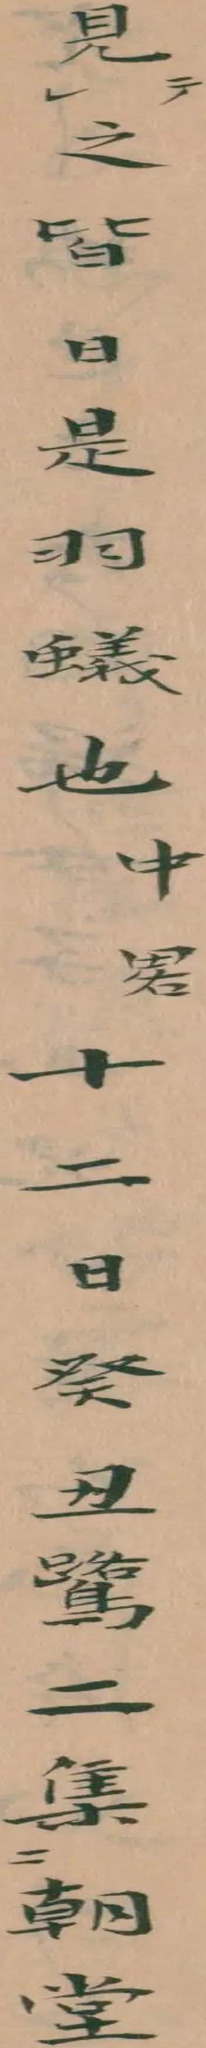見之皆日是羽蟻也中略十二日癸丑鷺二集朝堂
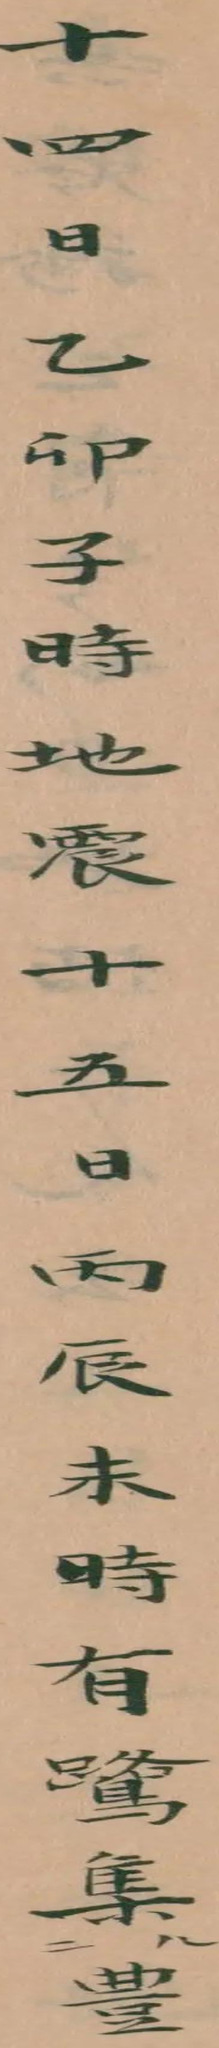十四日乙卯子時地震十五日丙辰未時有鷺集豊
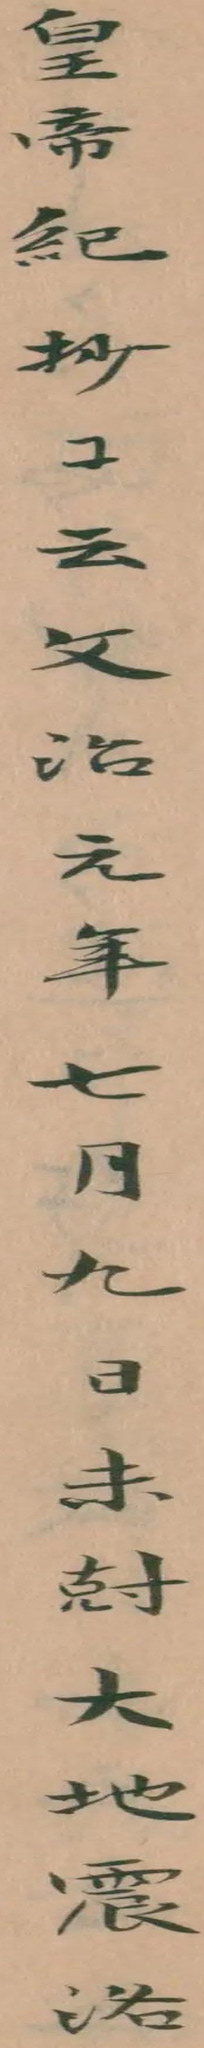皇帝紀抄に云文治元年七月九日未尅大地震洛
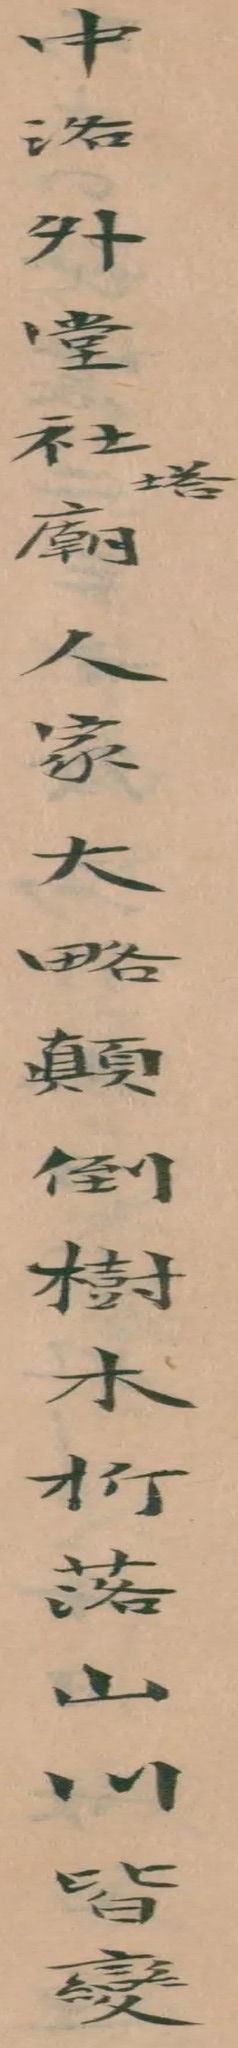中洛外堂社塔廟人家大略顛倒樹木折落山川皆変
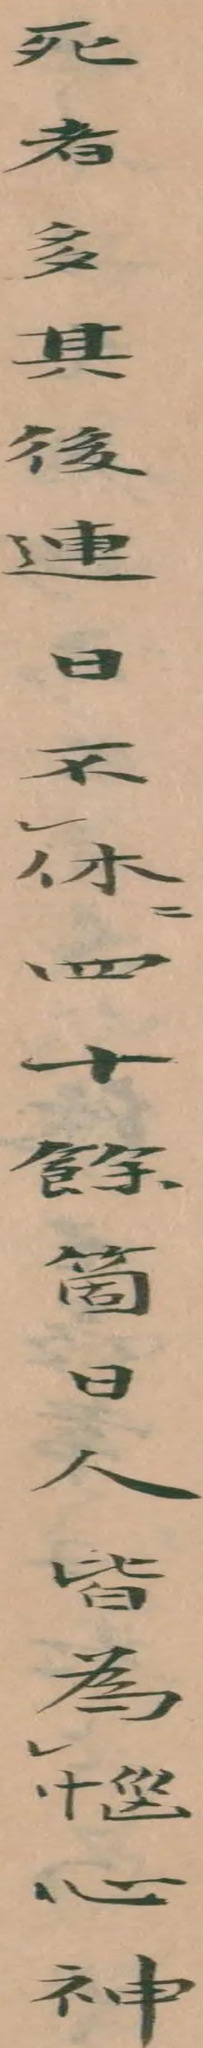死者多其後連日不休四十余箇日人皆為悩心神
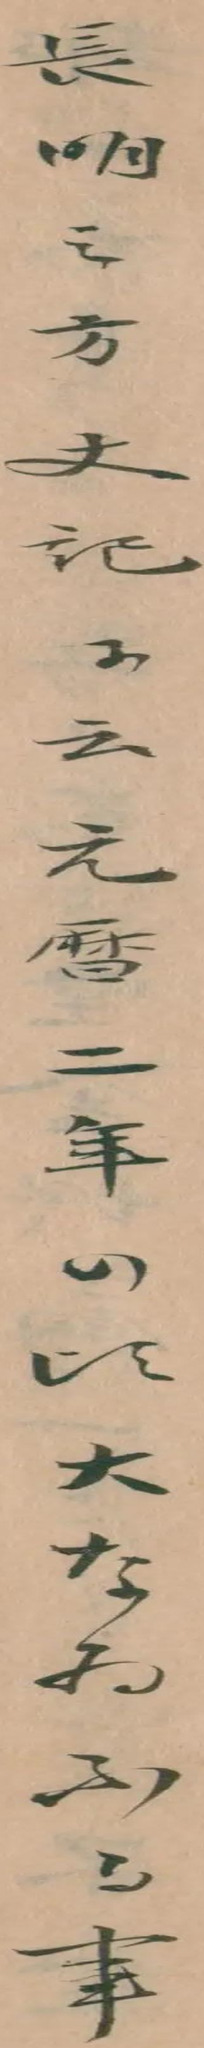長明之方丈記に云元暦二年の頃大なゐふる事
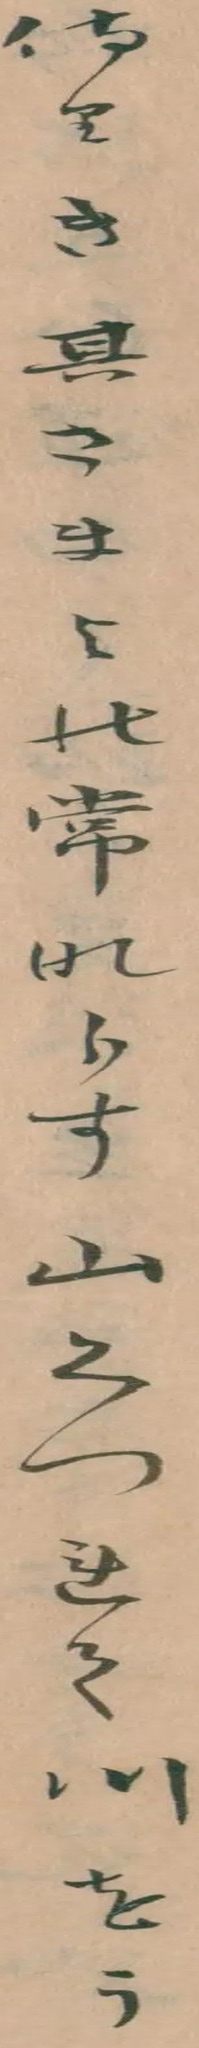侍りき其さまよの常ならす山くつれて川をう
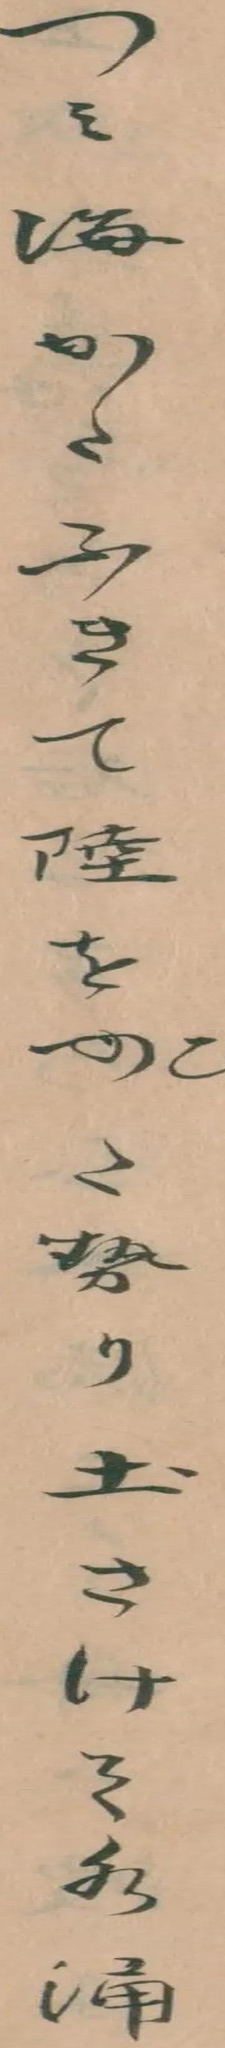つみ海かたふきて陸をひたせり土さけて水涌

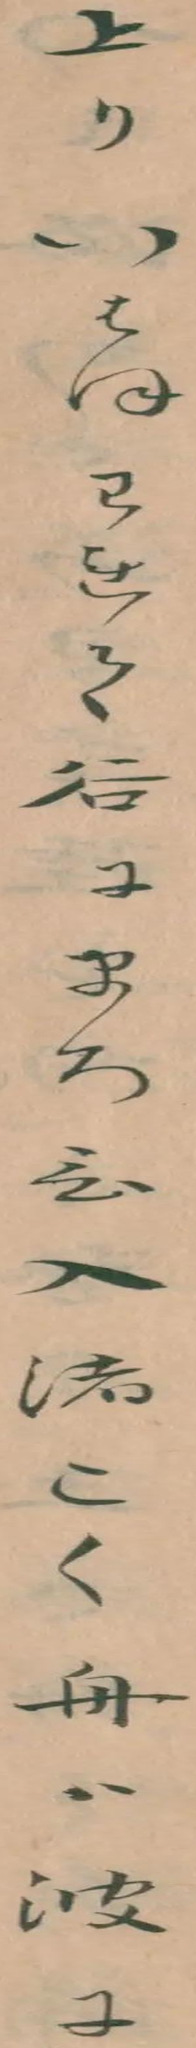上りいはほわれて谷にまろひ入諸こく舟は波に
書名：地災撮要. 巻5-6(地震之部)
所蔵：国立国会図書館 National Diet Library, JAPAN
